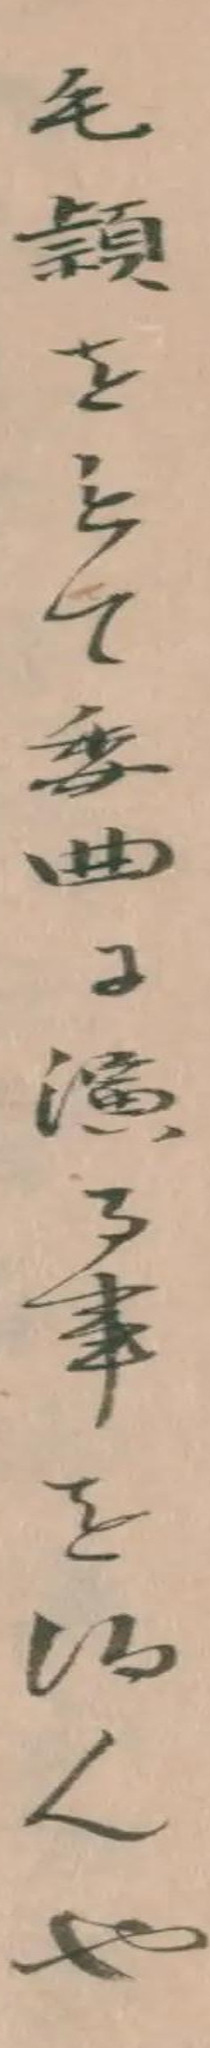毛頴をもて委曲に演る事を得んや
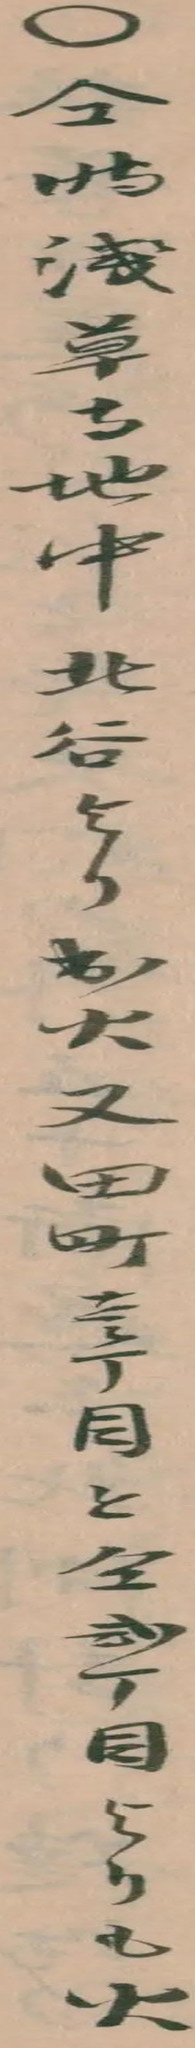〇仝時浅草寺地中北谷より出火又田町壱丁目と仝弐丁目よりも火
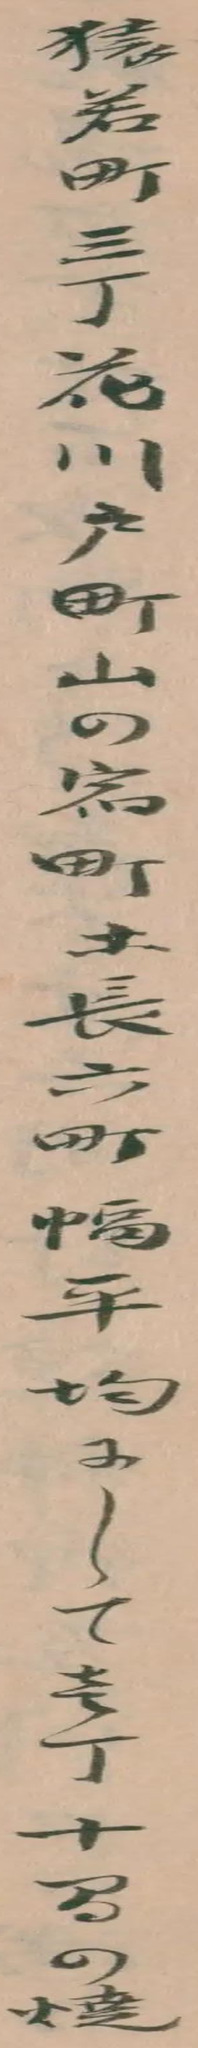猿若町三丁花川戸町山の宿町等長六町巾平均にして壱丁十間の焼
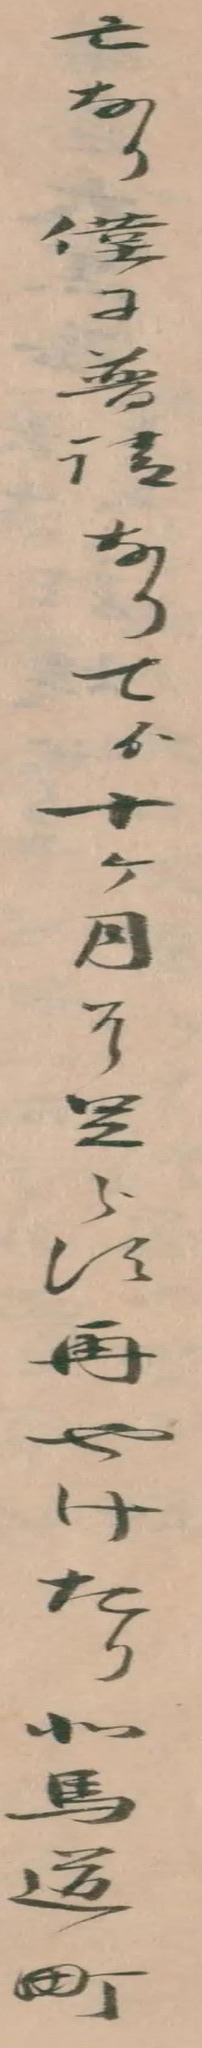亡なり僅に普請なりてゟ十ヶ月に足らす再やけたり北馬道町
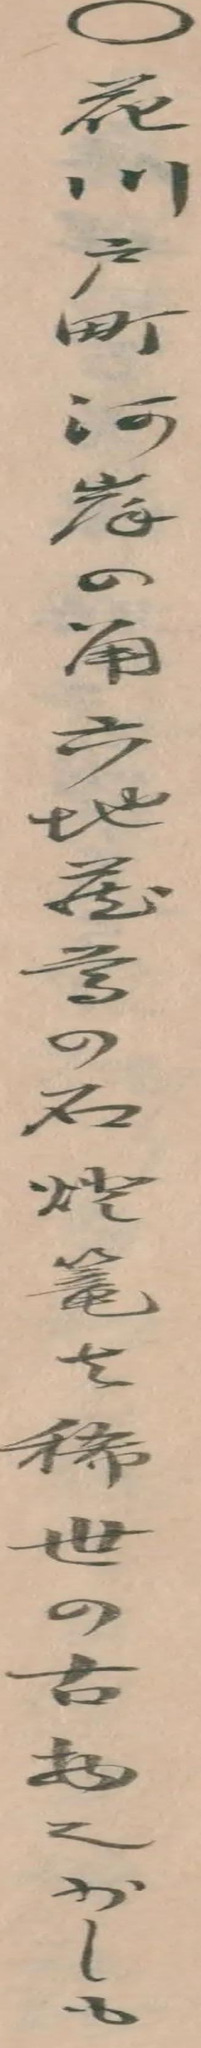〇花川戸町河岸の角六地蔵尊の石燈篭は希世の古物也少しも
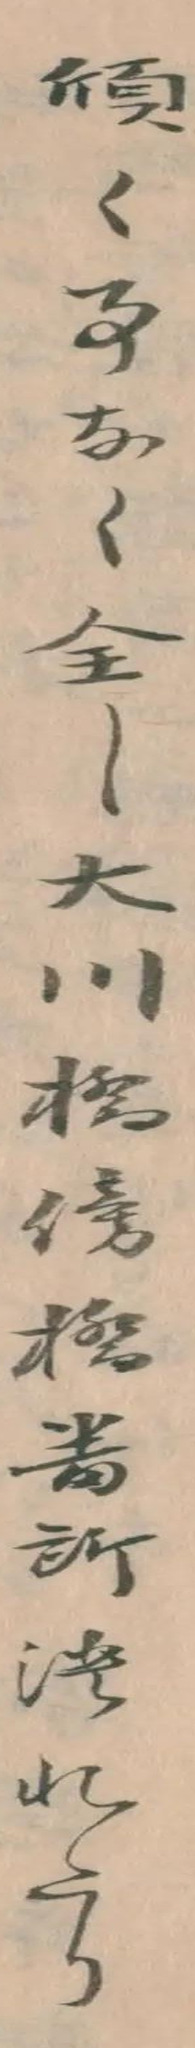傾く事なく全し大川橋傍橋番所潰れたり

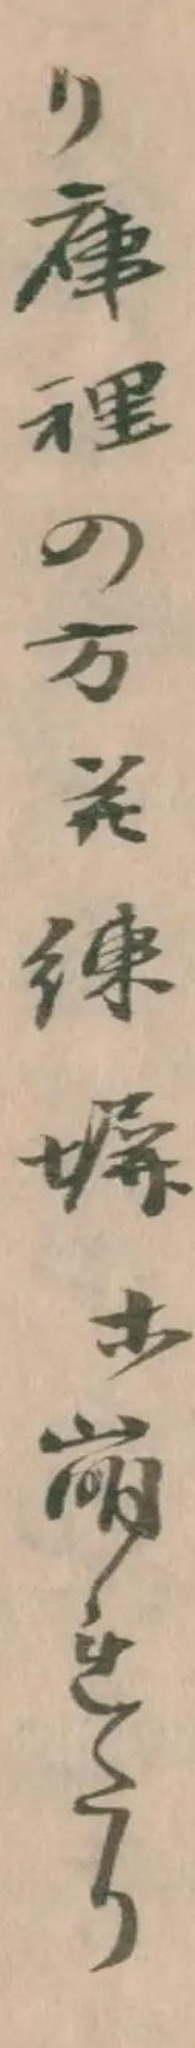り庫裏の方并練塀等崩れたり
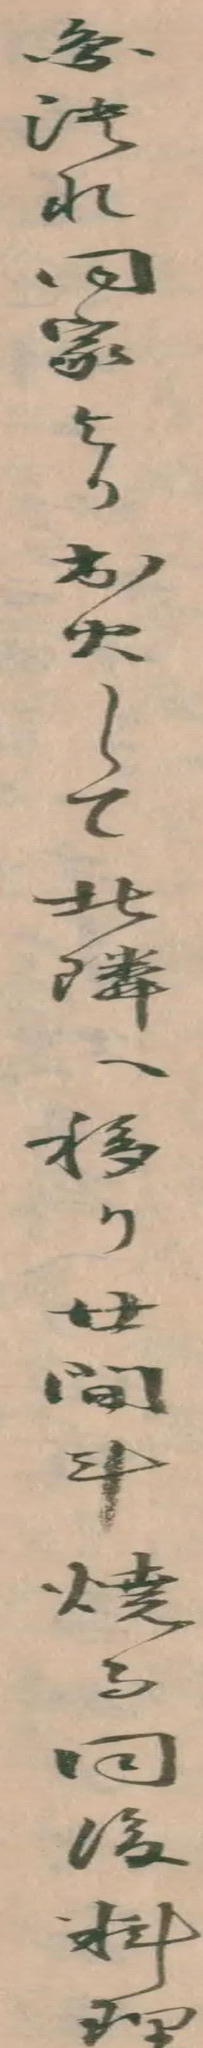円潰れ同家より出火して北隣へ移り廿間斗焼る同後料理
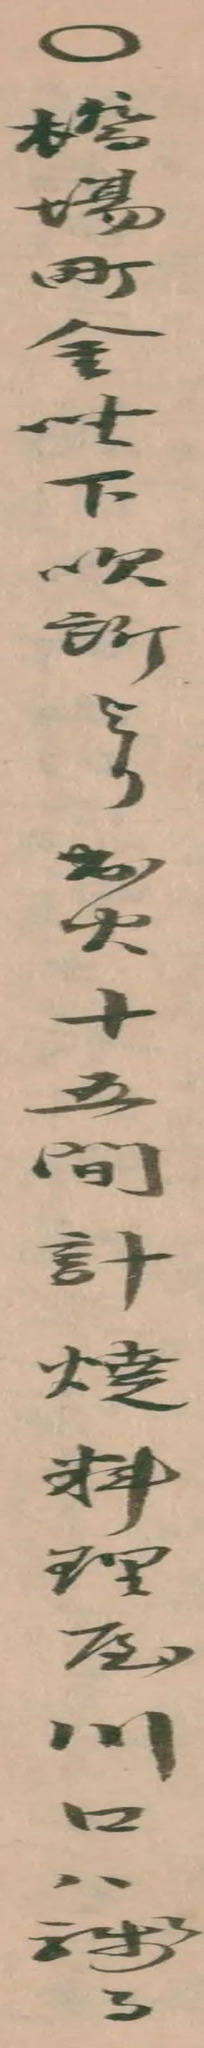○橋場町金坐下吹所より出火十五間計焼料理屋川口は残る
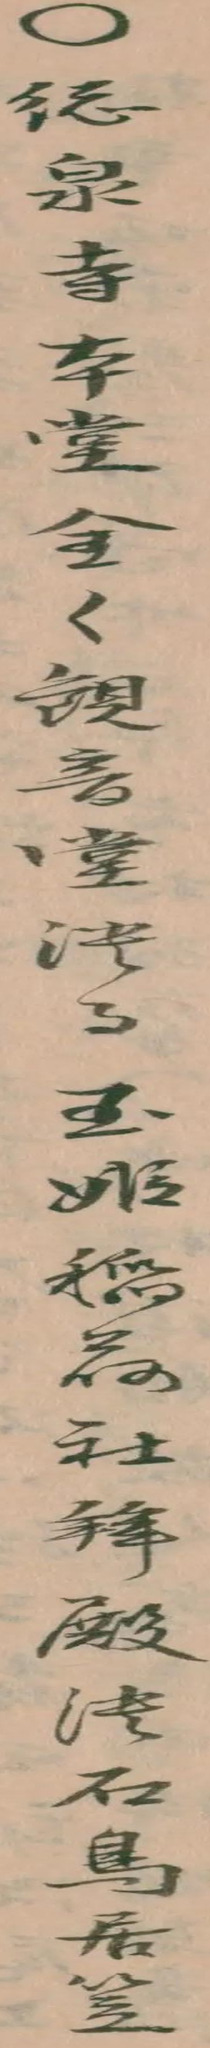○総泉寺本堂全く観音堂潰る玉姫稲荷社拝殿潰石鳥居井笠
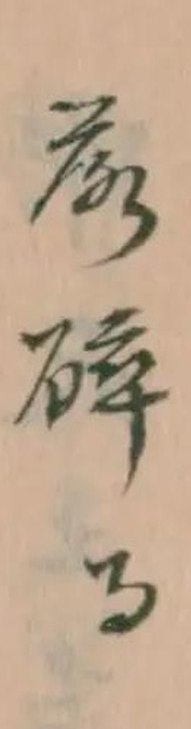落砕る
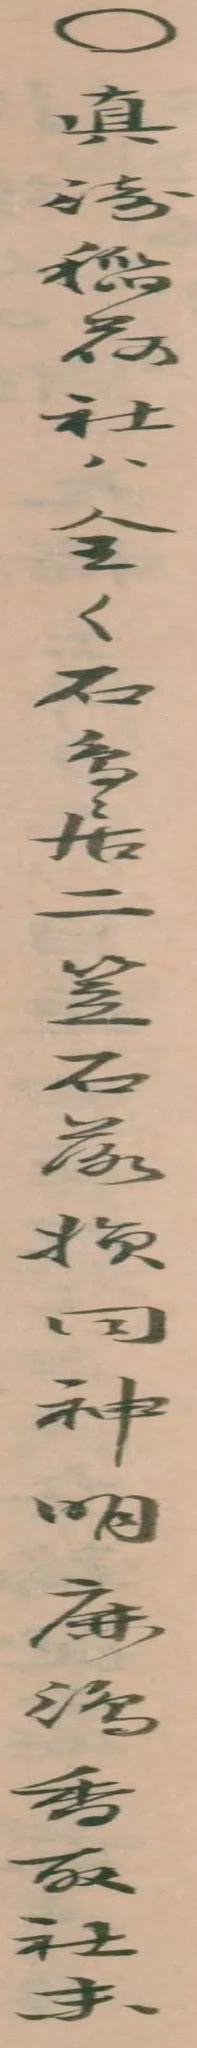〇真崎稲荷社は全く石鳥居二笠石落損同神明鹿嶋香取社未
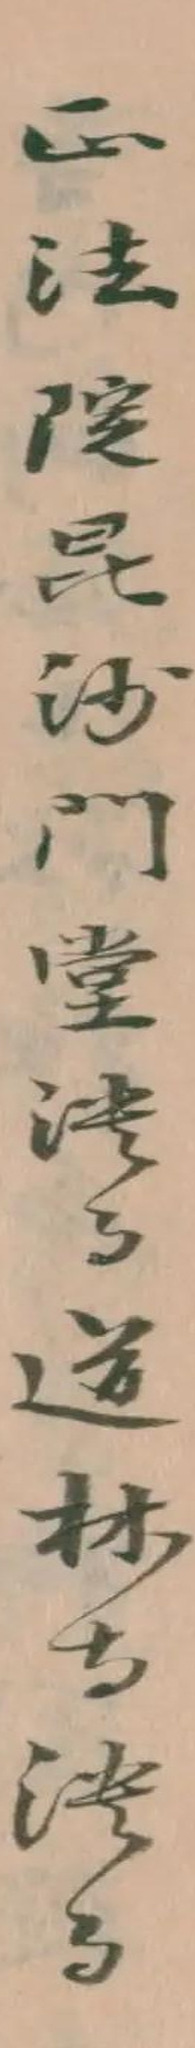正法院毘沙門堂潰る道林寺潰る
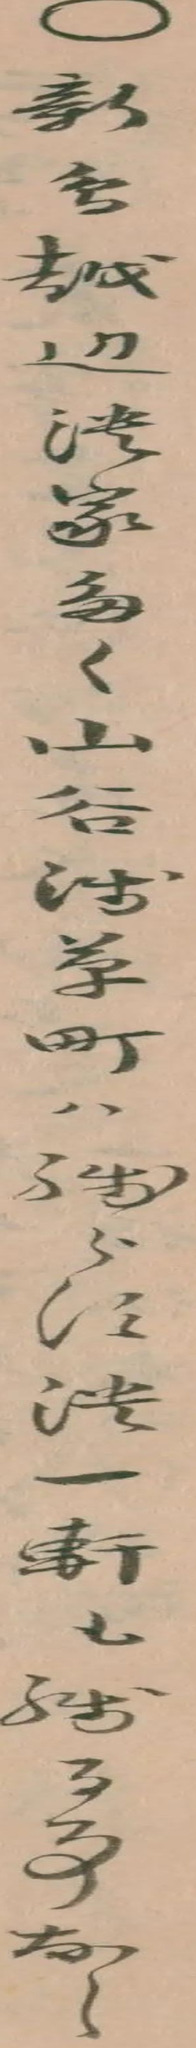〇新鳥越辺潰家多く山谷浅草町は残らす潰一軒も残る事なし
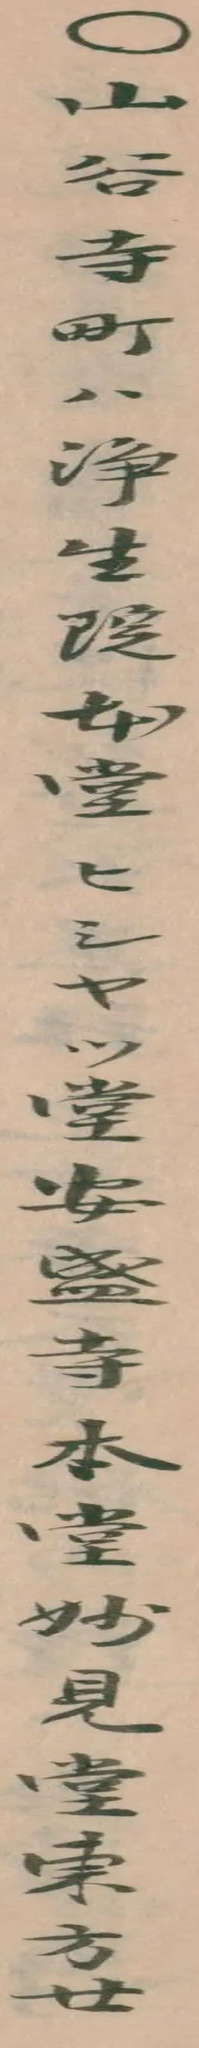〇山谷寺町は浄生院本堂ヒシヤツ堂安盛寺本堂妙見堂東方廿
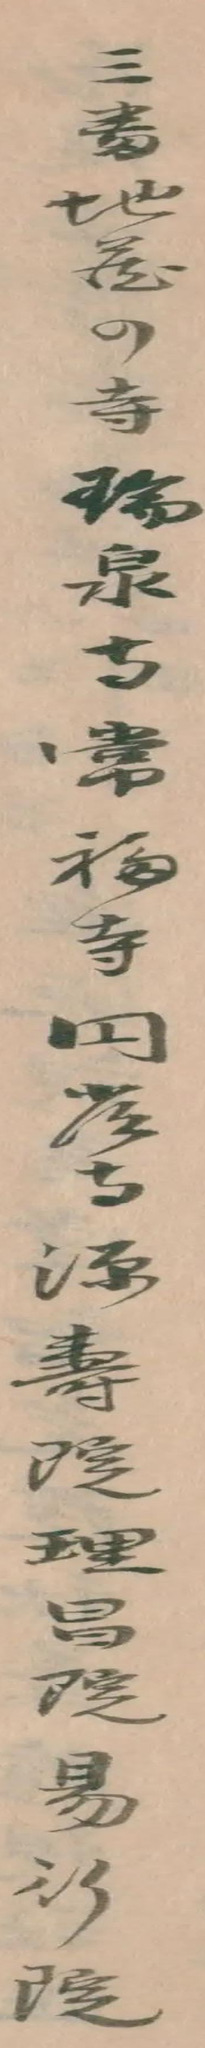三番地蔵の寺瑞泉寺常福寺円常寺源寿院理昌院易行院
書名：地災撮要. 巻7-9(地震之部)
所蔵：国立国会図書館 National Diet Library, JAPAN
